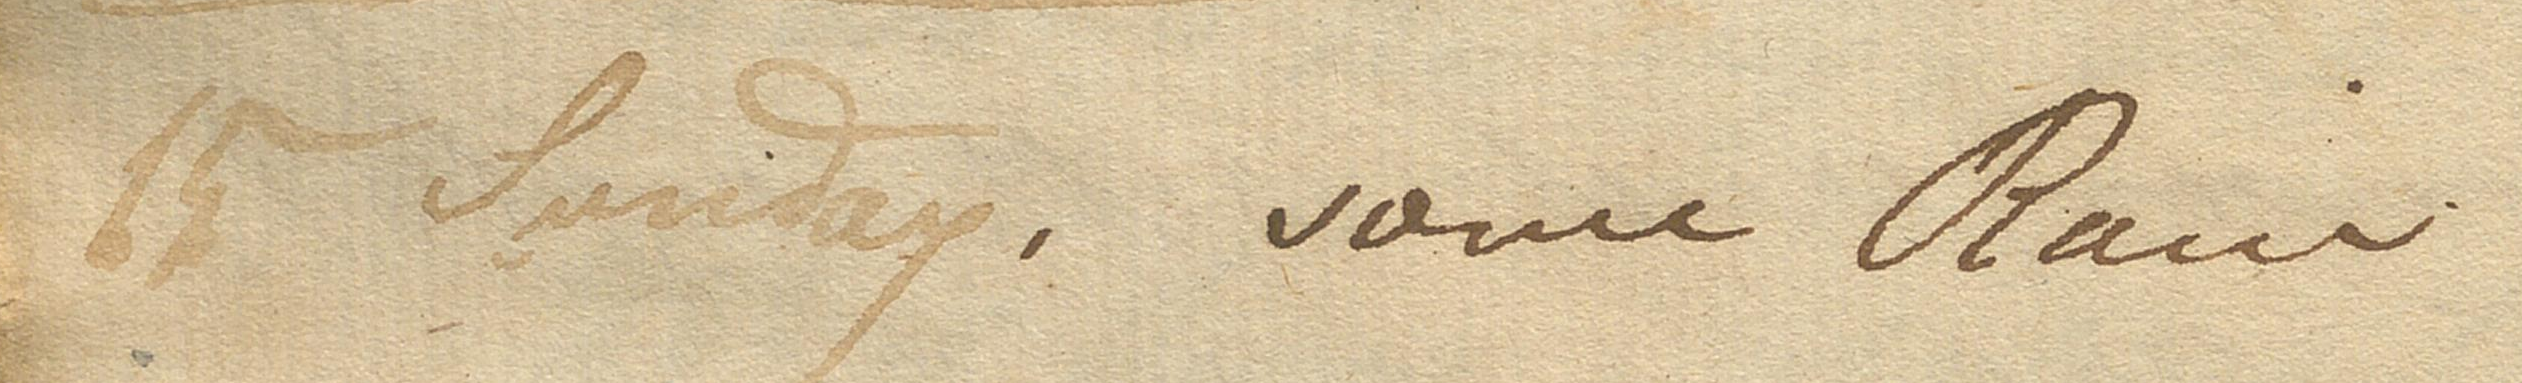15 Sunday, some Rain
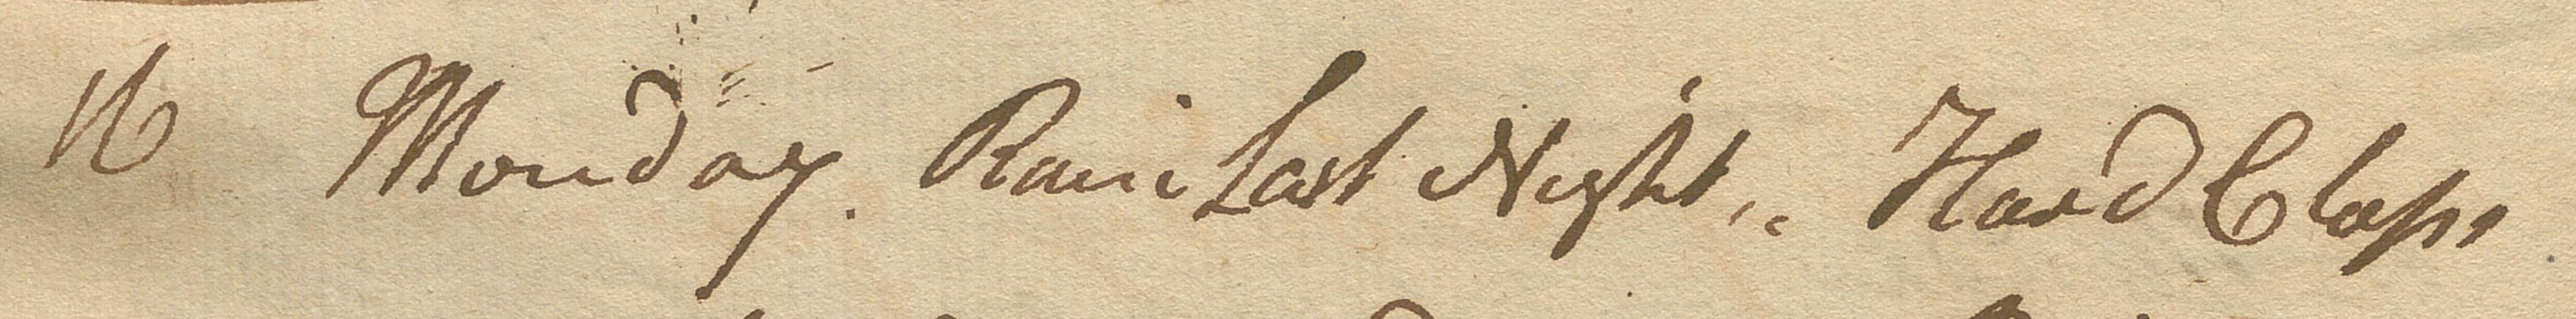16 Monday Rain Last Night. Hard Claps
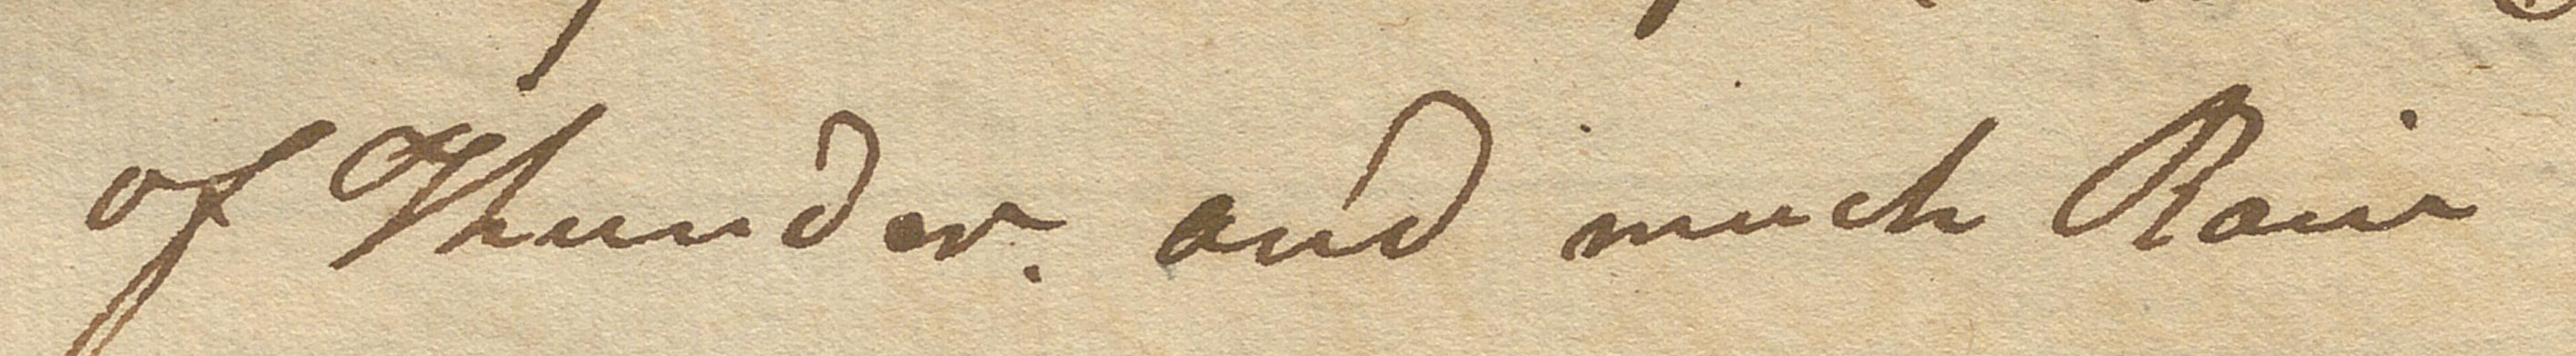of Thunder, and much Rain
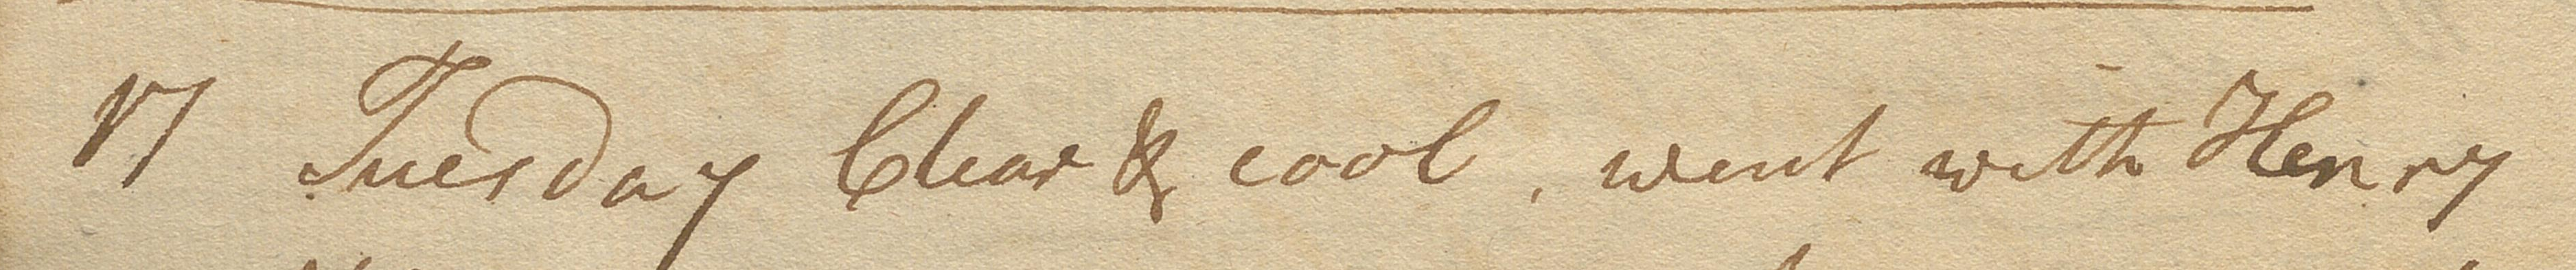17 Tuesday Clear & cool, went with Henry
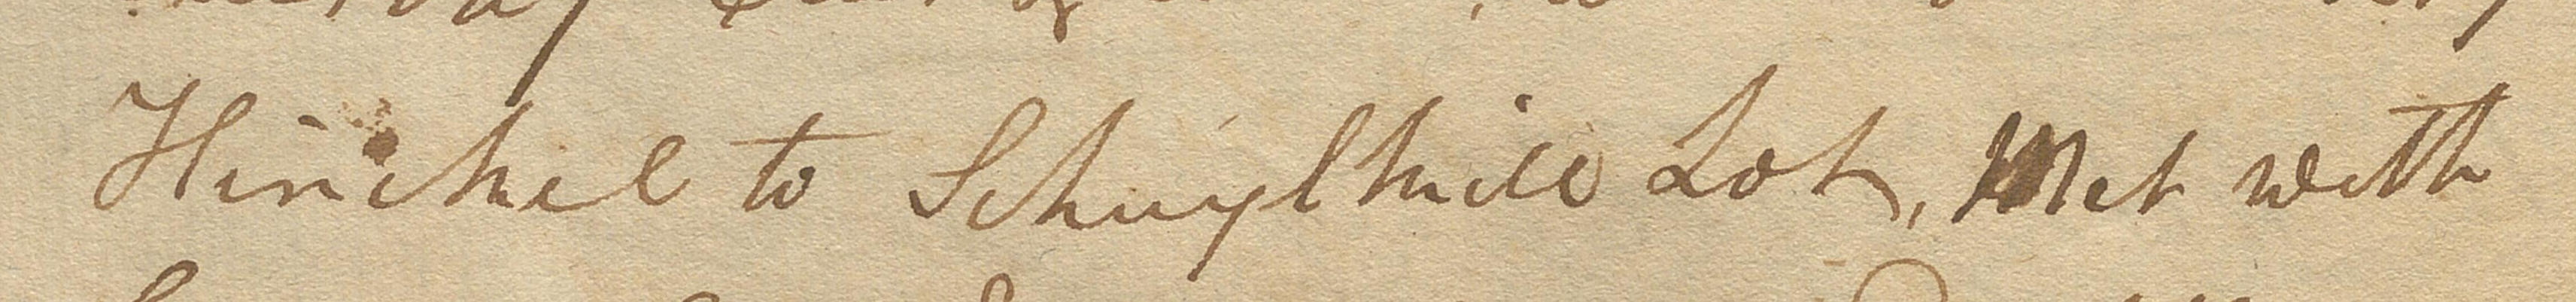Hinckel to Schuylkill Lot, Met with
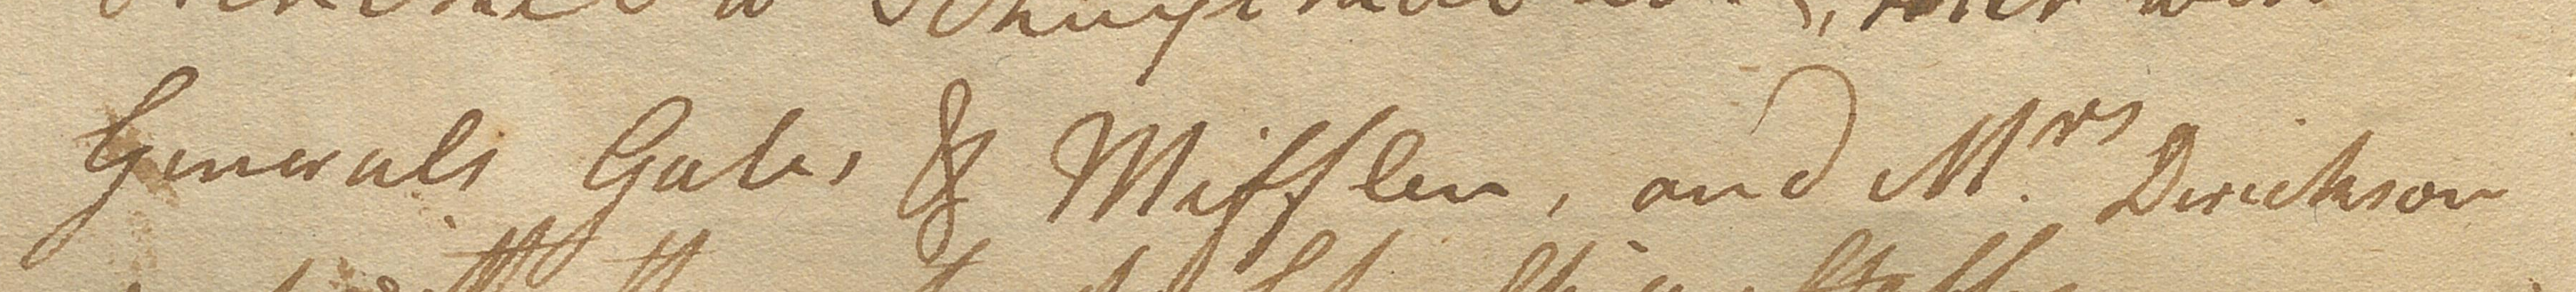Generals Gates & Mifflin, and M^rs. Derickson
